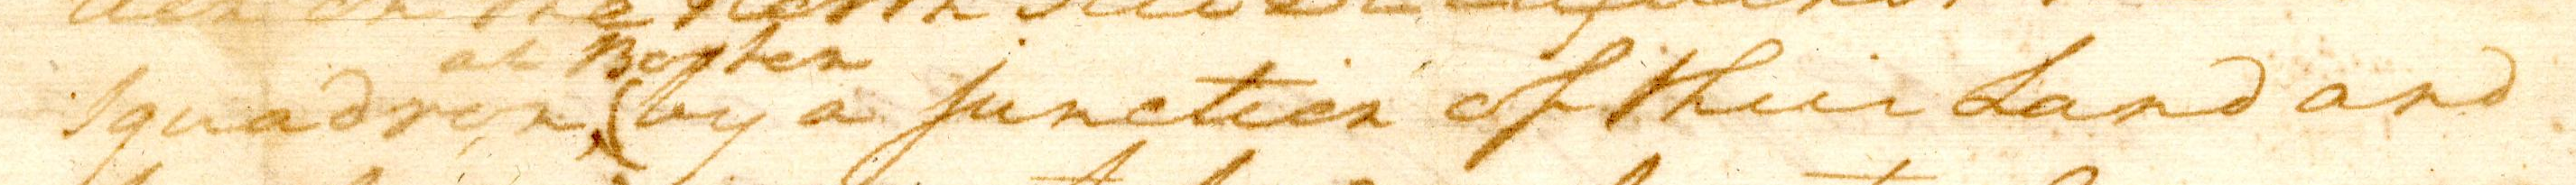squadron ^ (by a junction of their Land and
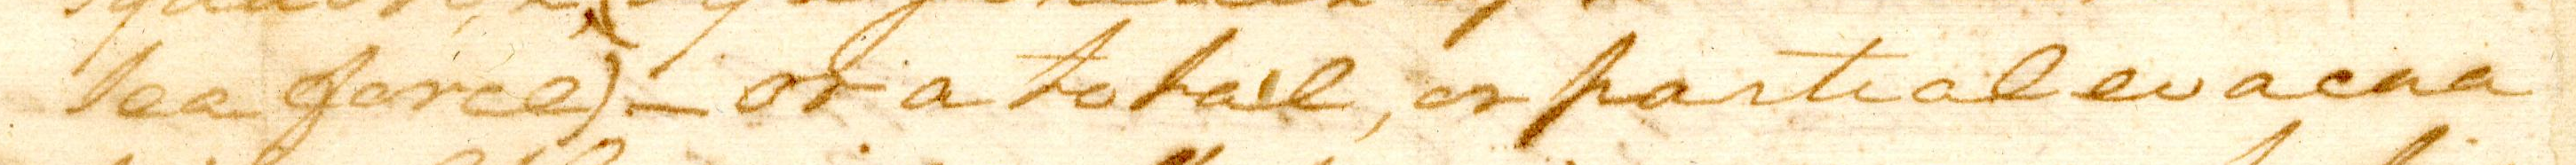sea force)- of a total, or partial evacua-
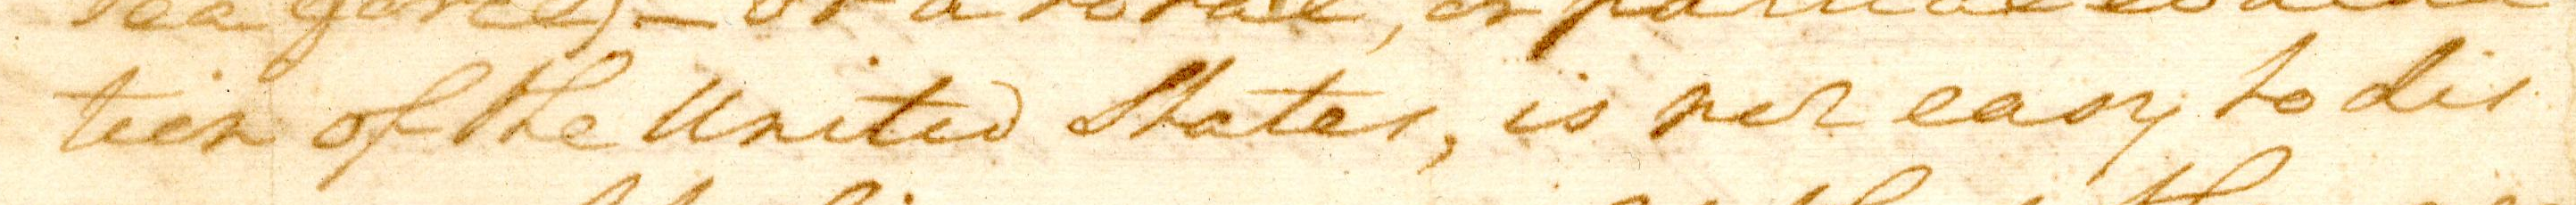-tion of the United States, is not easy to dis
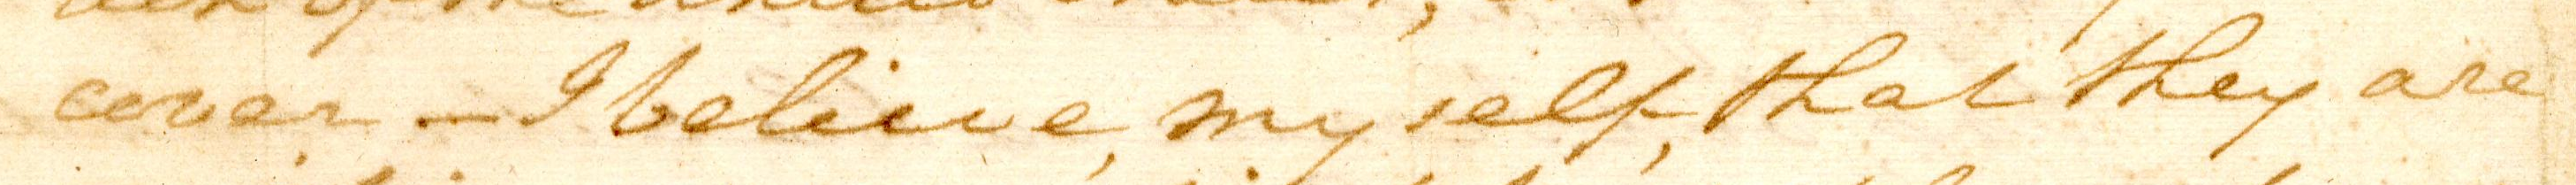cover- I believe myself, that they are
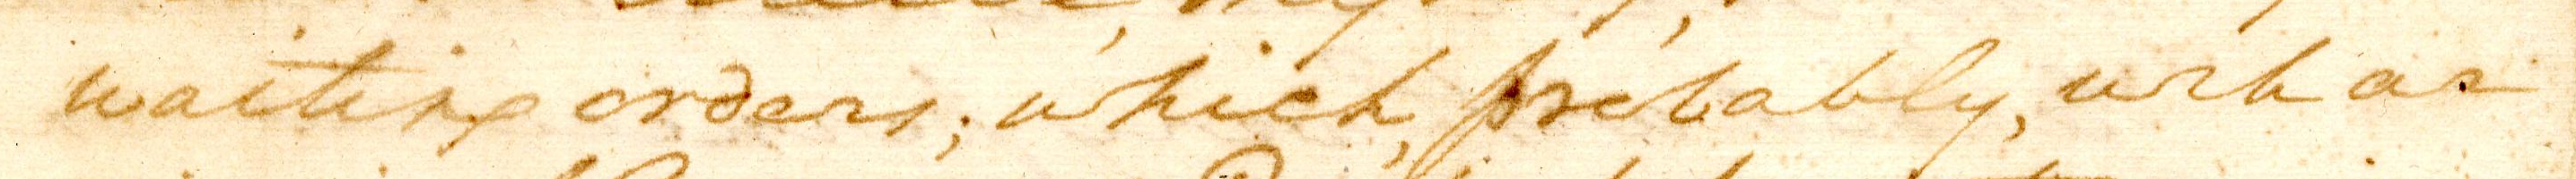waiting orders; which probably wish ar
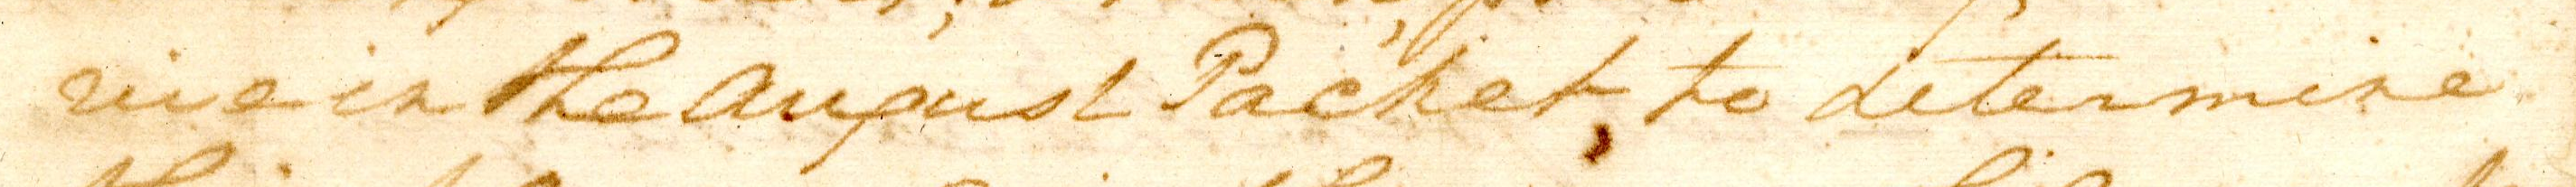rive in the August Packet, to determine
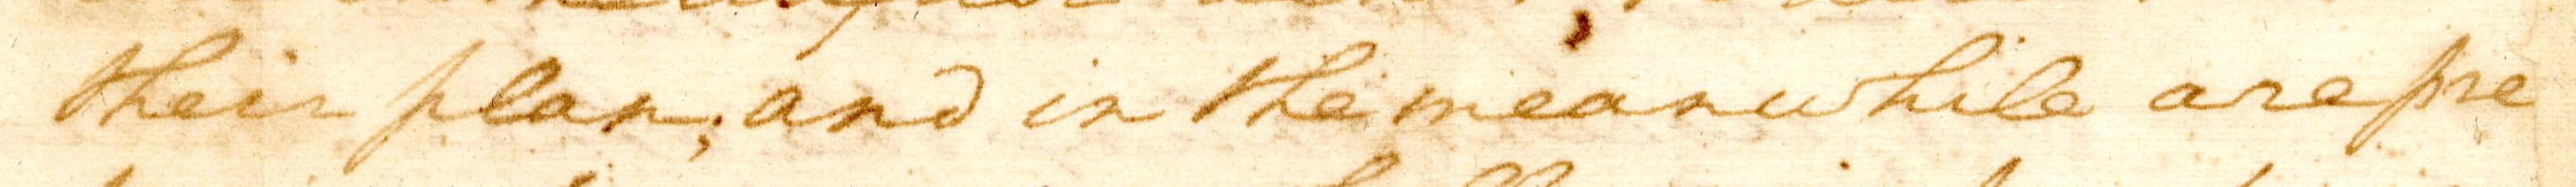their plan; and in the meanwhile are pre
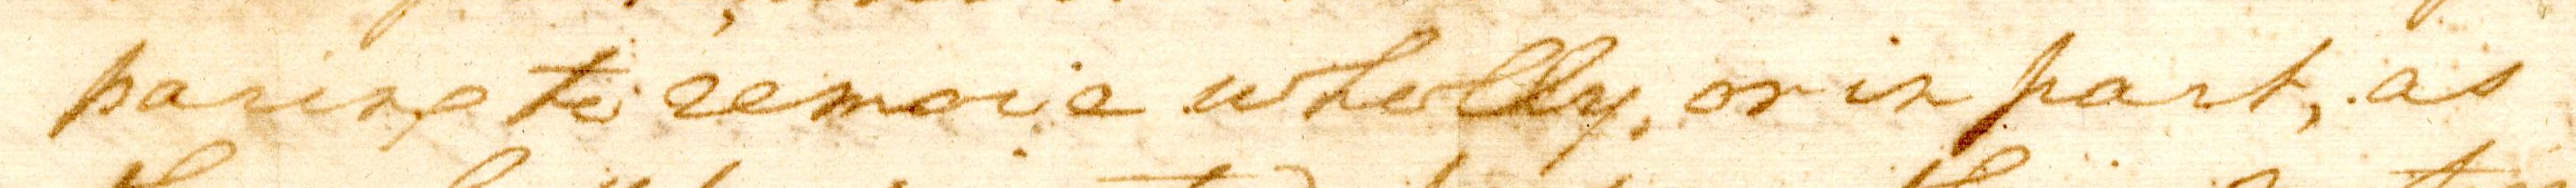paring to remove wholly, or in part, as
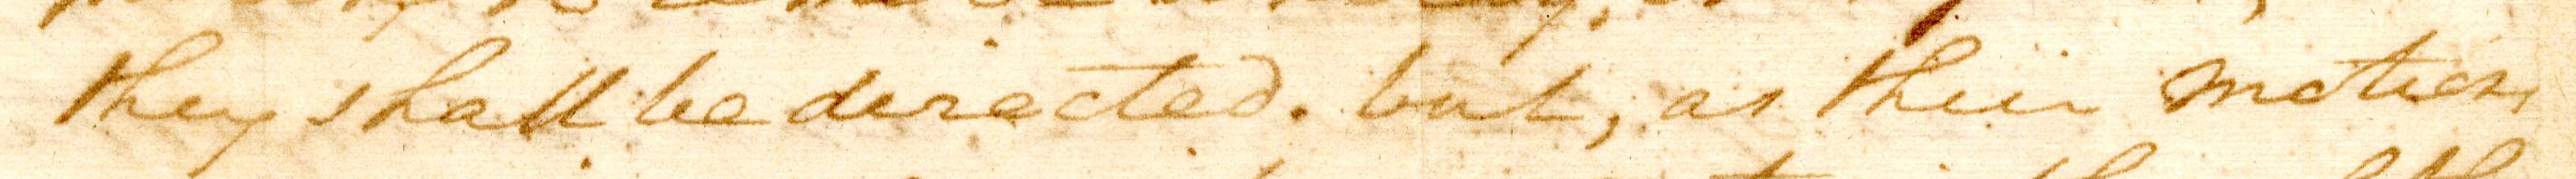they shall be directed. but, as their motions
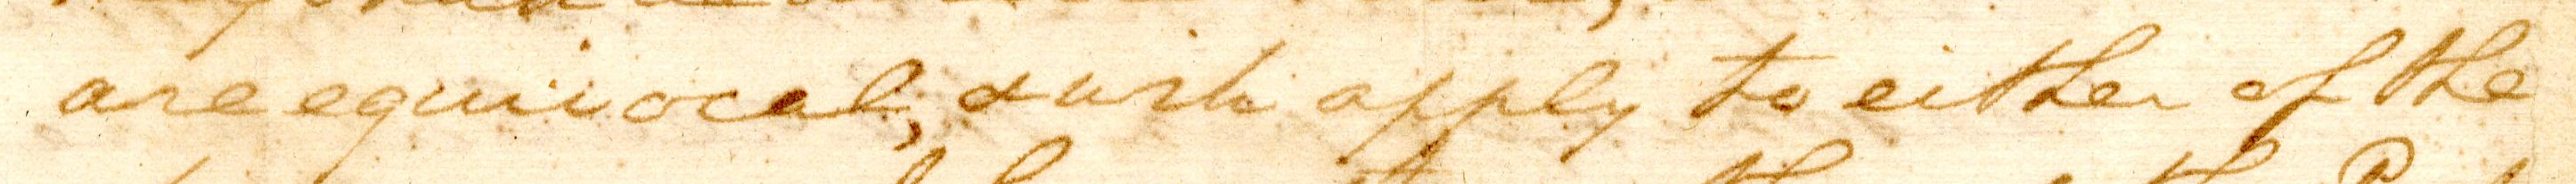are equivocal, & unto apply to either of the
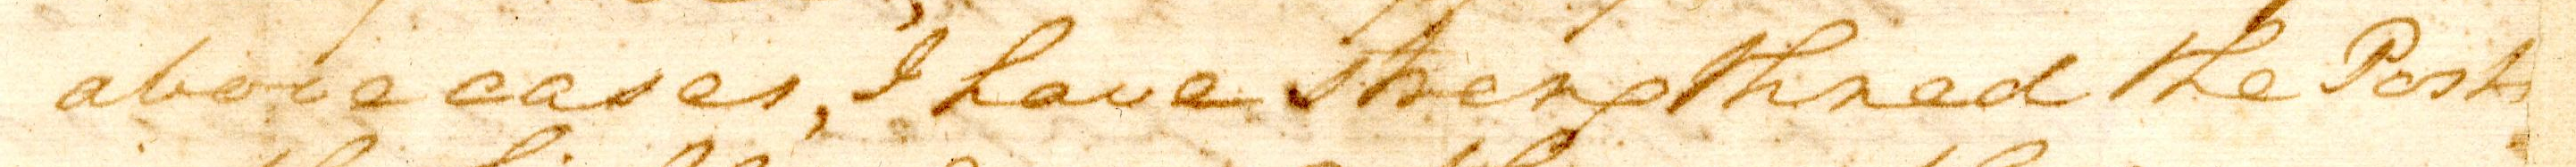above cases, I have strengthned the Post
